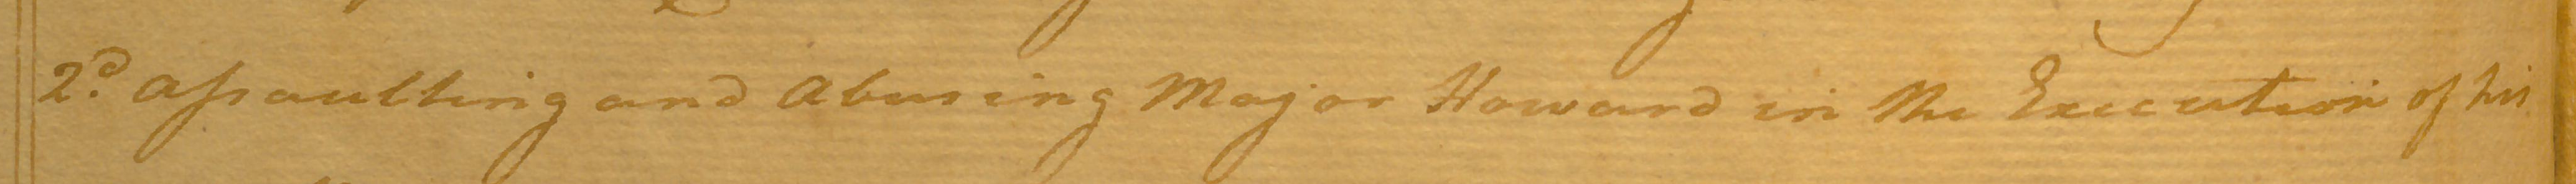2^d. assaulting and abusing Major Howard in the Execution of his
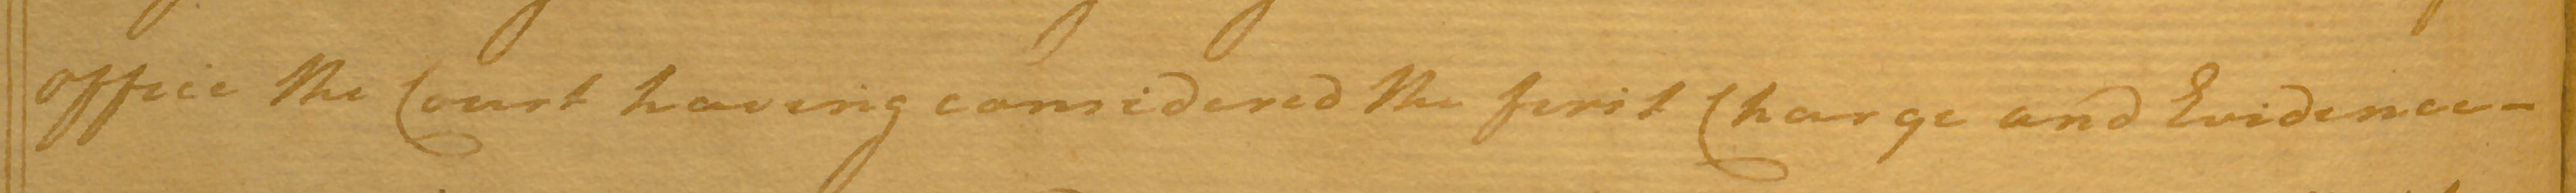office the Court having considered the first Charge and Evidence-
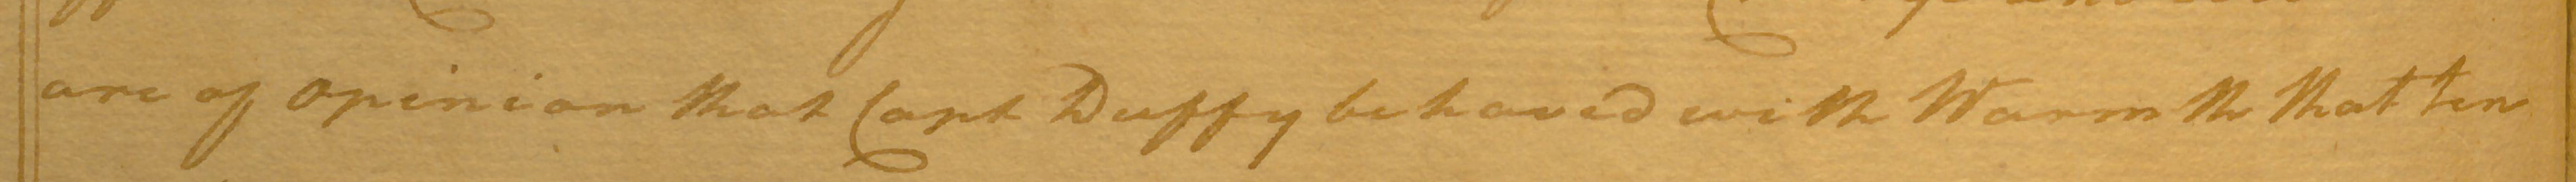are of opinion that Capt Duffy behaved with Warmth that ten
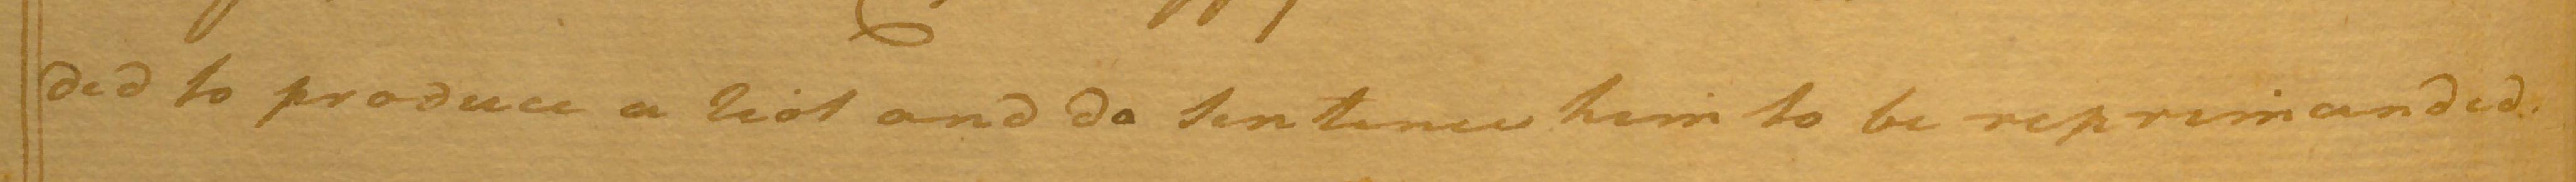ded to produce a riot and do sentence him to be reprimanded
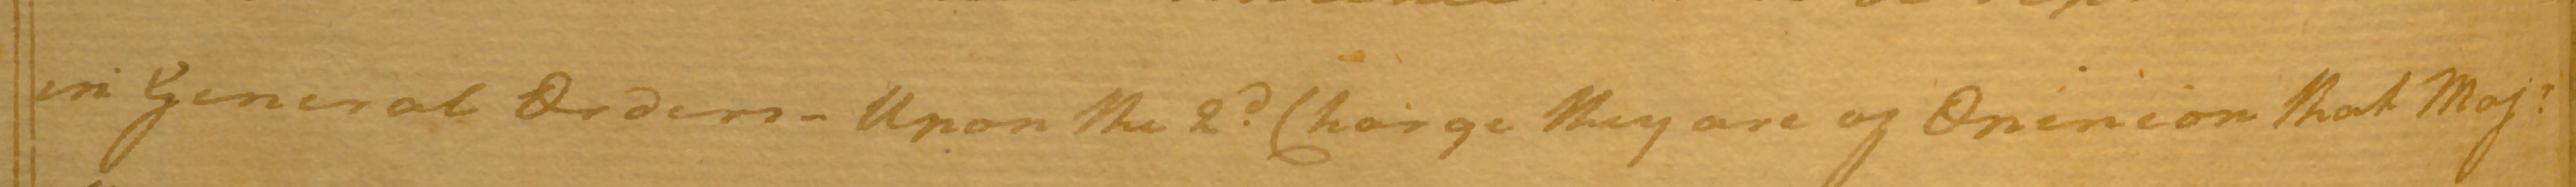in General Orders- Upon the 2^d. Charge they are of Opinion that Maj^r.
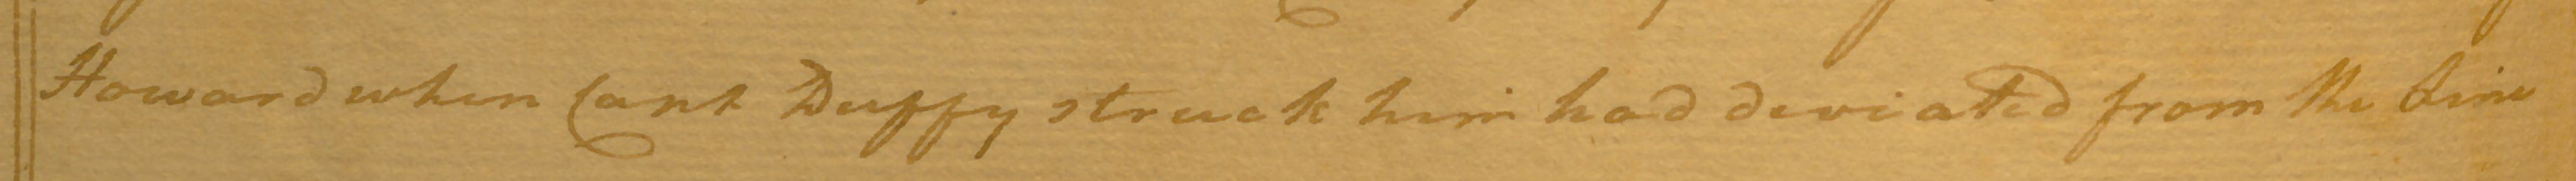Howard when Capt Duffy struck him had deviated from the Line
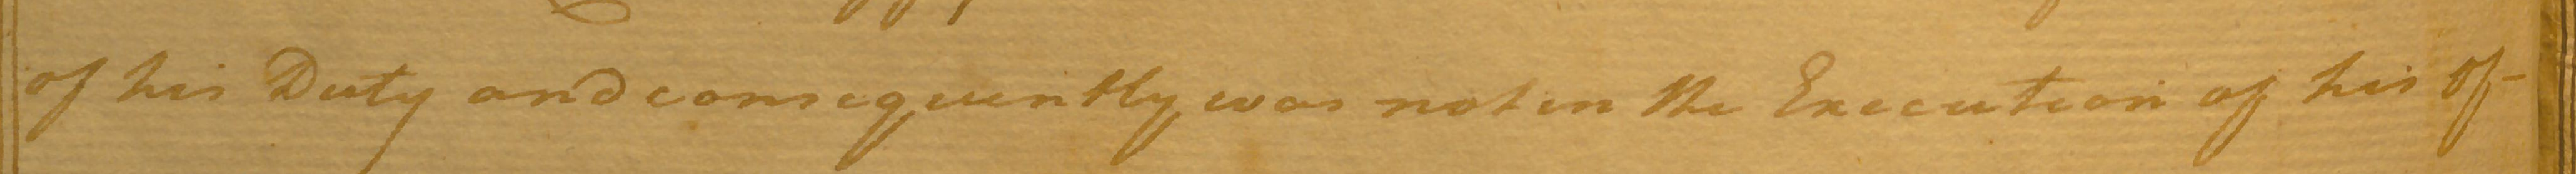of his Duty and consequently was not in the Execution of his Of-
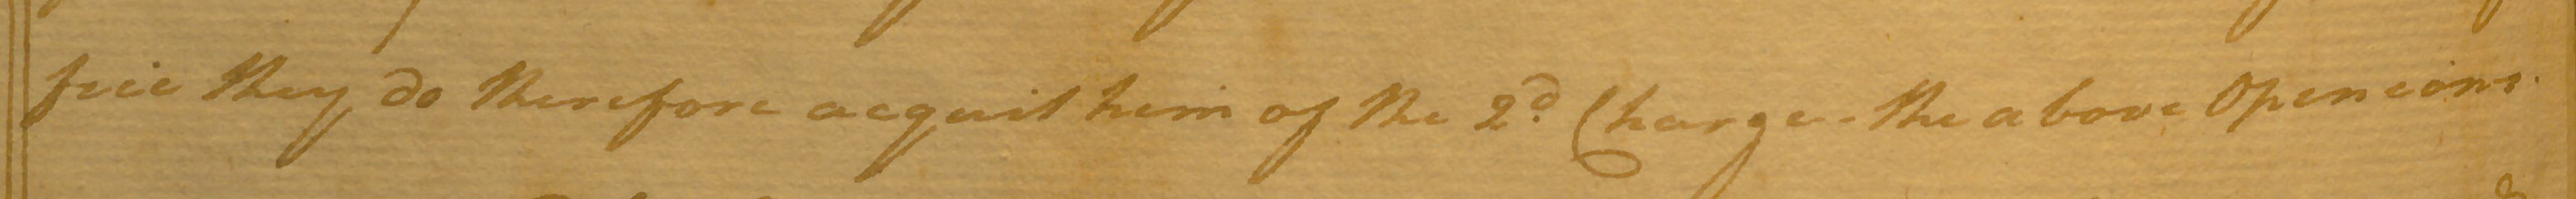fice they do therefore acquit him of the 2^d. Charge. the above Opinions
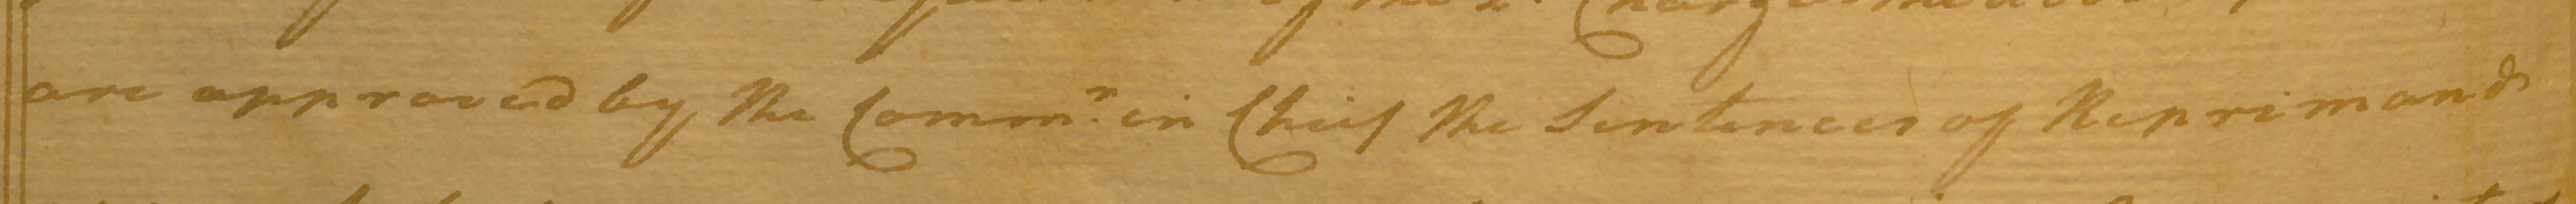are approved by the Comm^r. in Chief the Sentences of Reprimand
